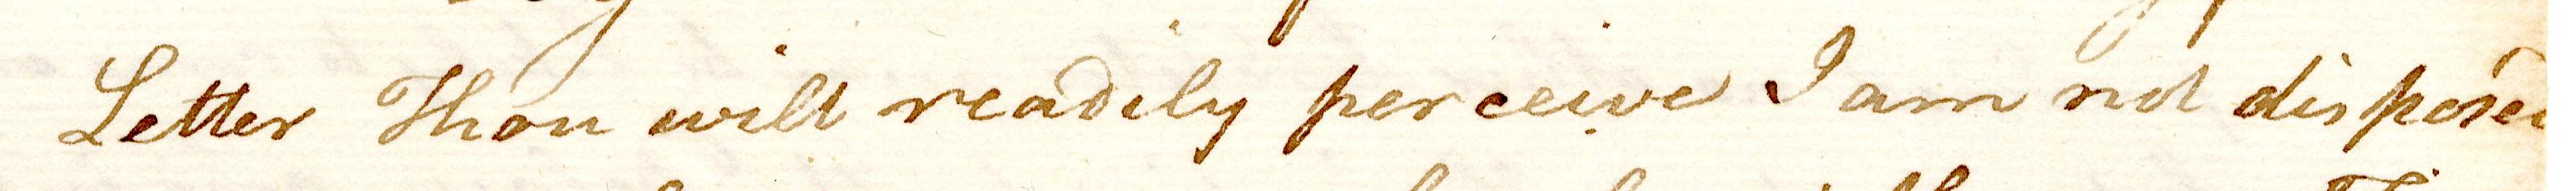Letter Thou will readily perceive I am not disposed
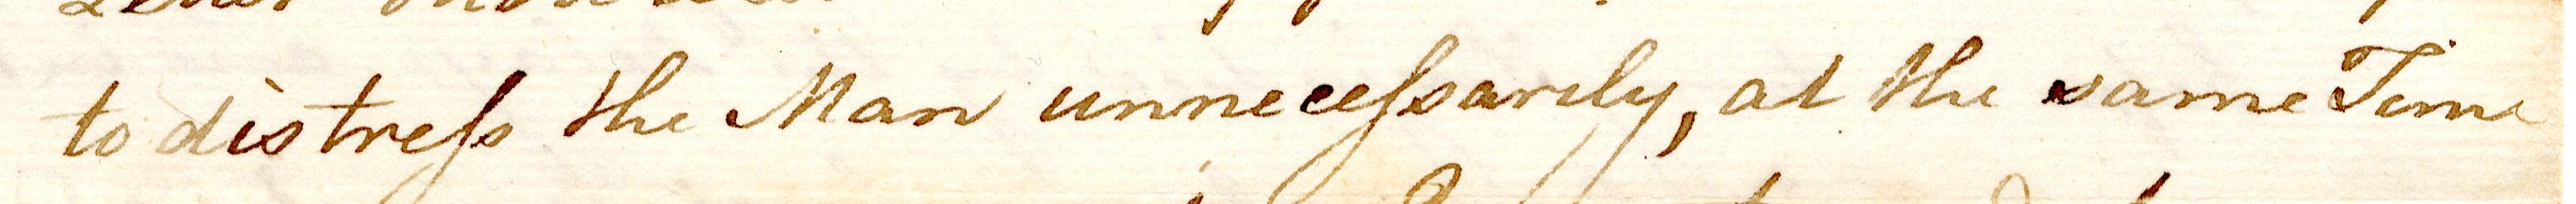to distress the Man unnecessarily, at the same Time
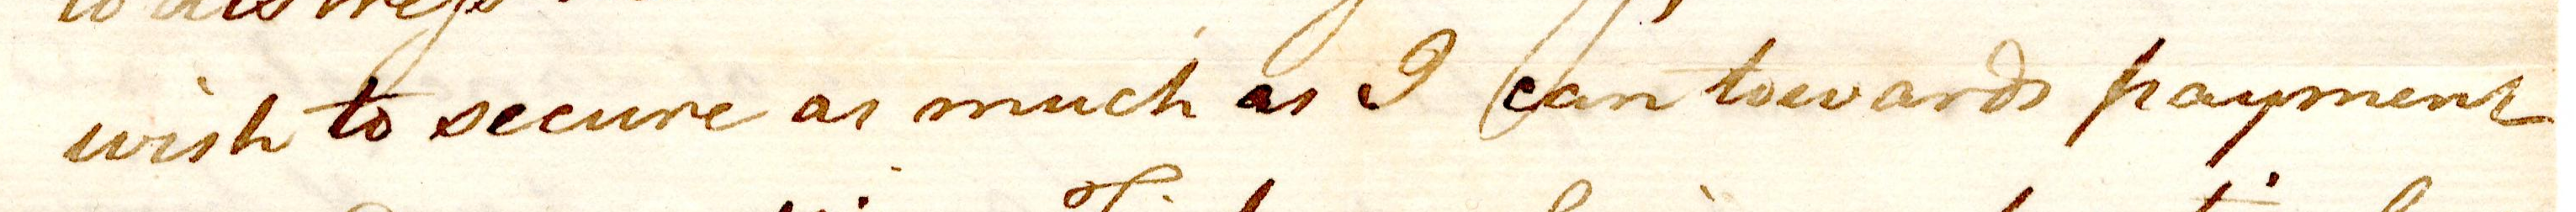wish to secure as much as I can towards payment
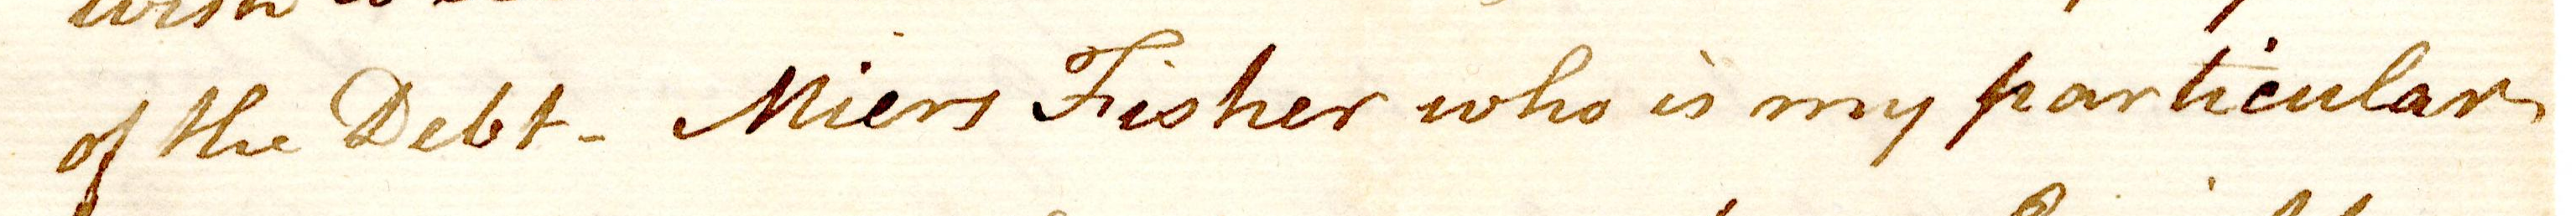of the Debt. Miers Fisher who is my particular
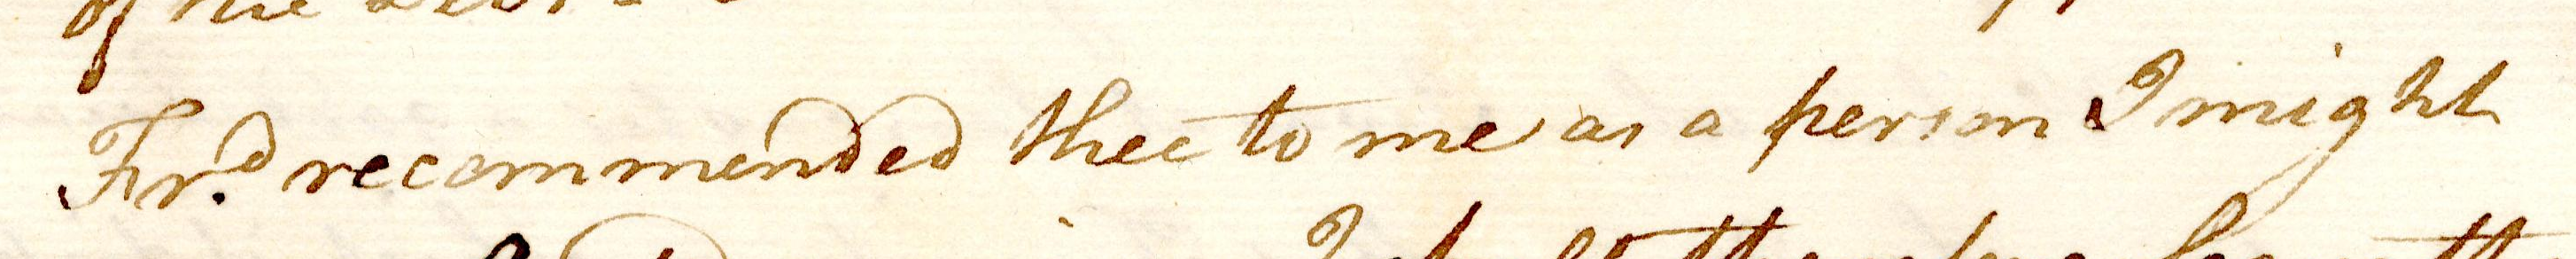Fr^d. recommended thee to me as a person I might
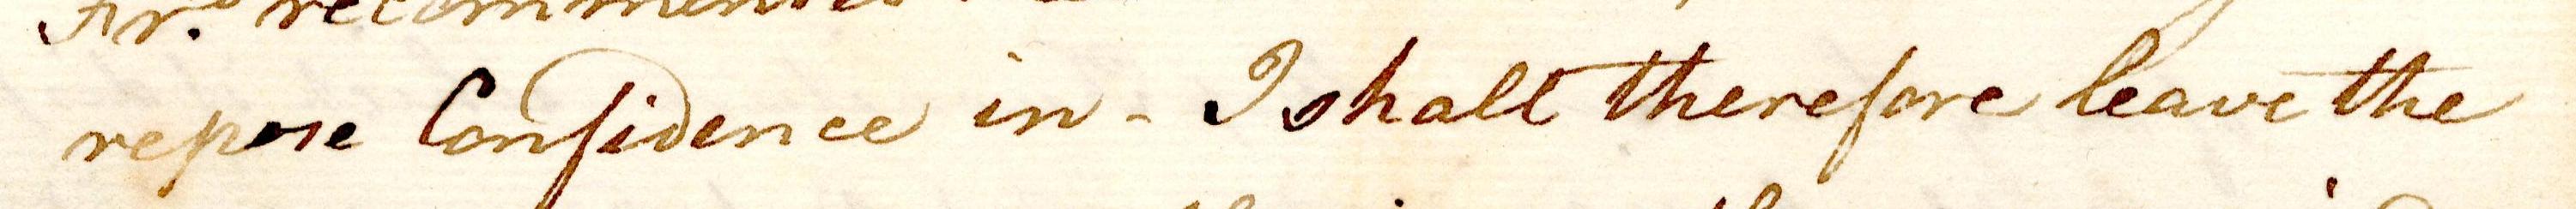repose Confidence in. I shall therefore leave the
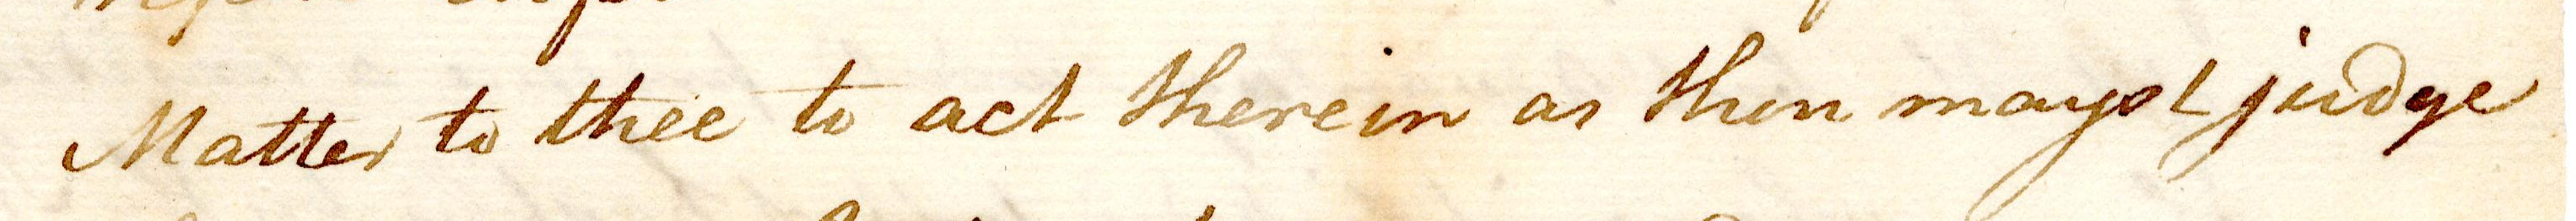Matter to thee to act therein as then mayst judge
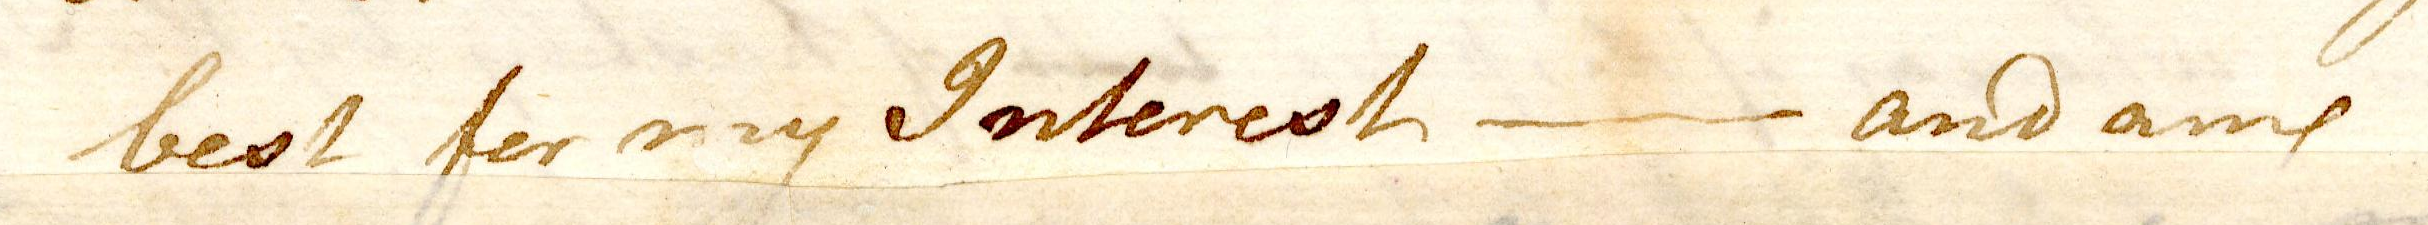best for my Interest- and am
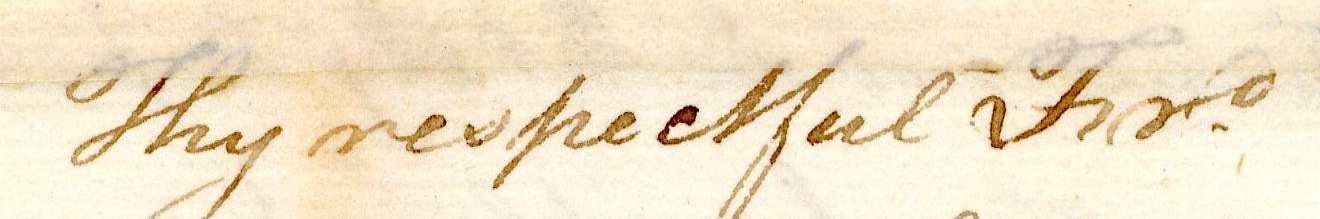Thy respectful Fr^d.
